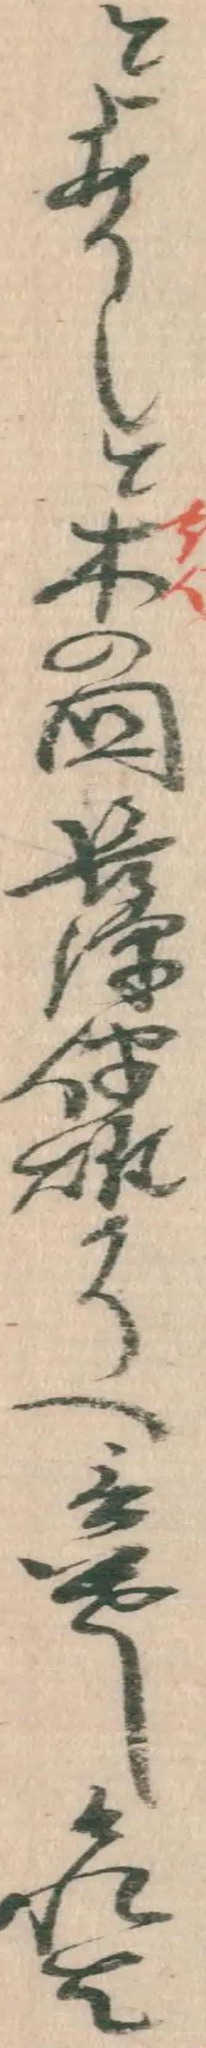とよめりしと紀伊木の国長沢伴雄方へ言遣しけれは
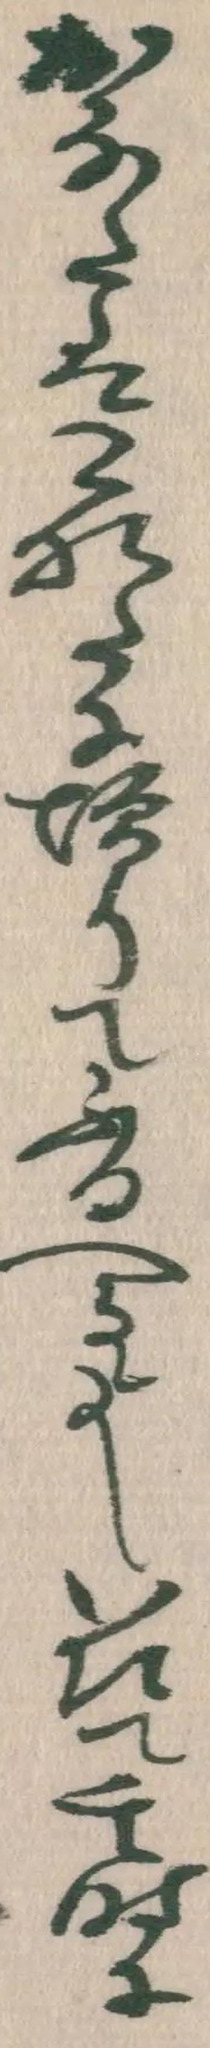かなたはこなたに増りてふるへるよしいひて其時に
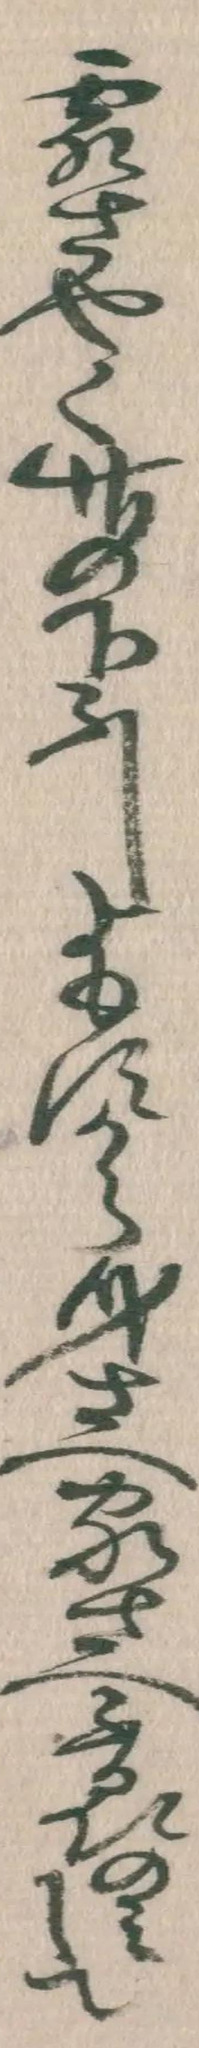震さやく竹の下ふしよもすから身さへ家さへふるひのみして
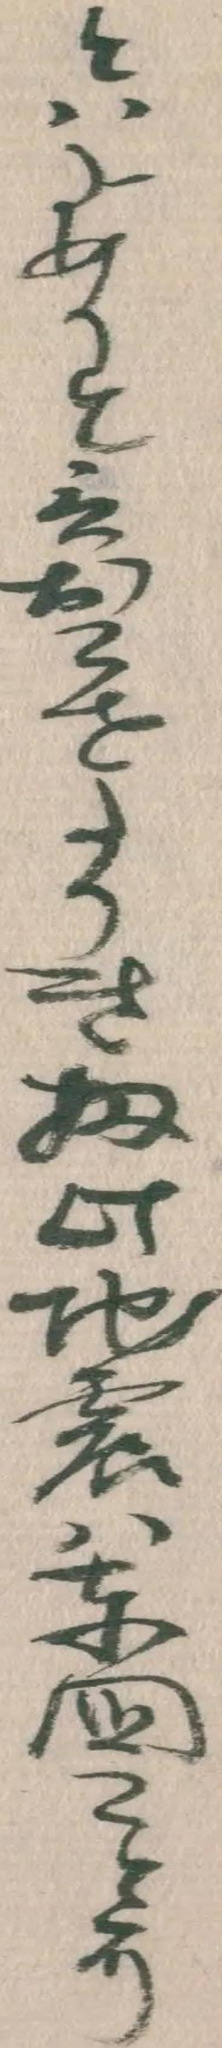とはよめりと言おこせたりき扨此地震は東国ことに
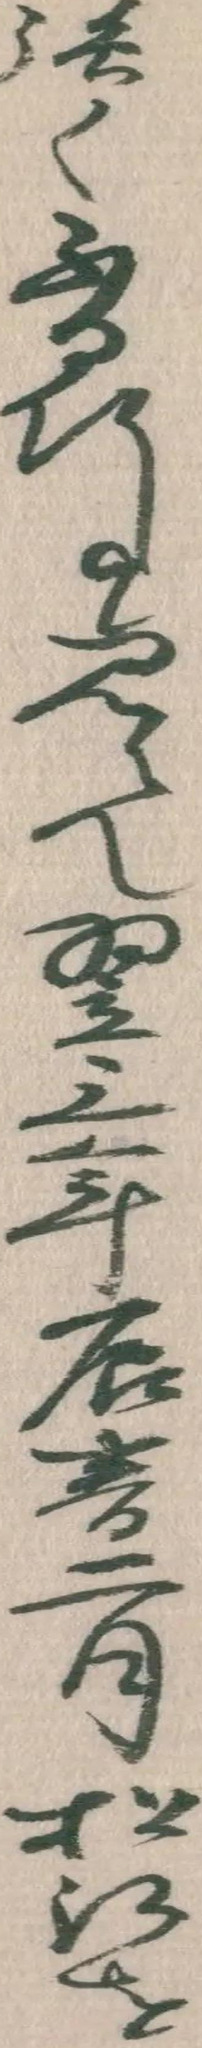強くふるひしと見へて翌三年辰春二月松江を
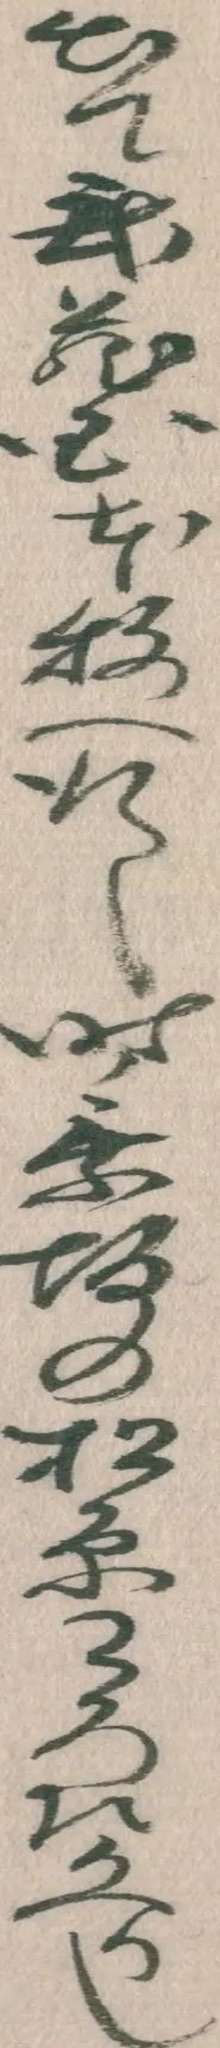出て武蔵国本牧へ行し時乗坂の松原ころひかへりし
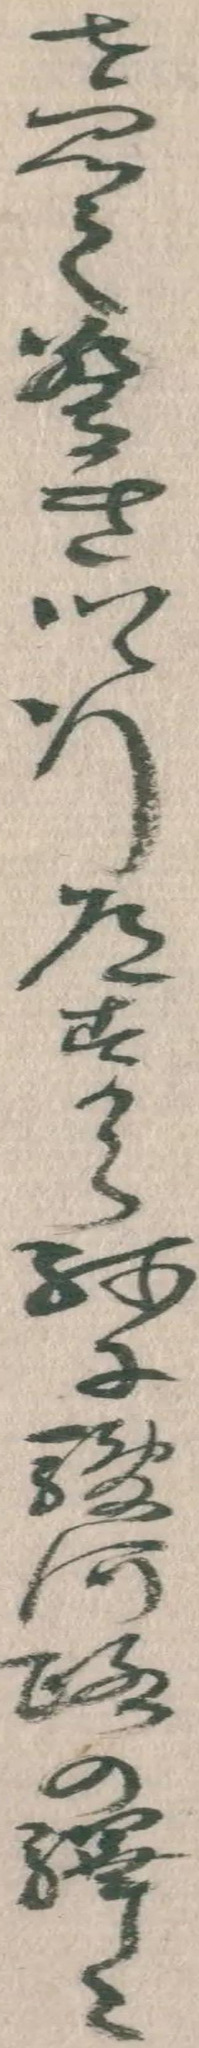を見て驚きつゝ行道すから殊に駿河路の駅々
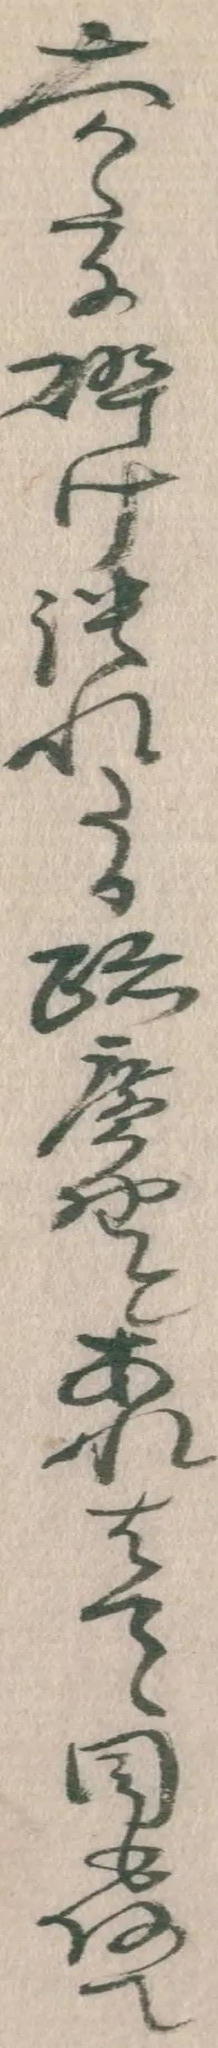大かたに砕け潰れたる跡広野とあれはてゝ目もあて
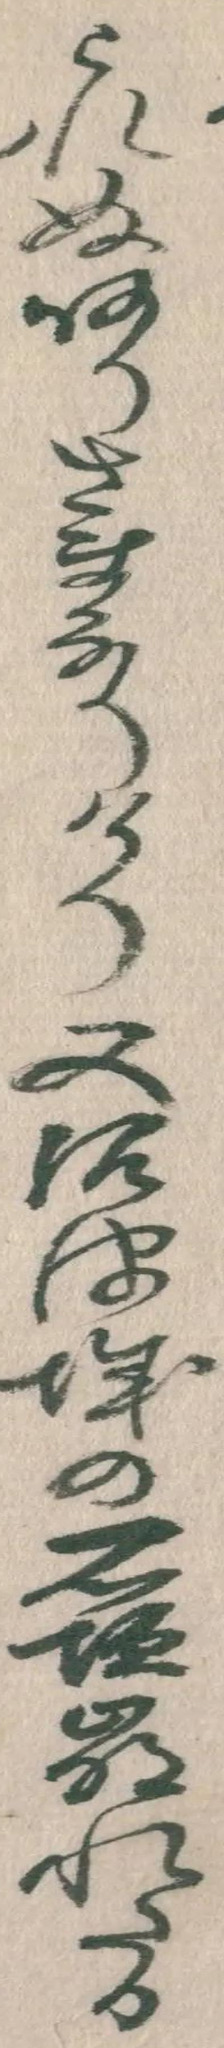られぬありさまなりけり又沼津城の石垣崩れたる
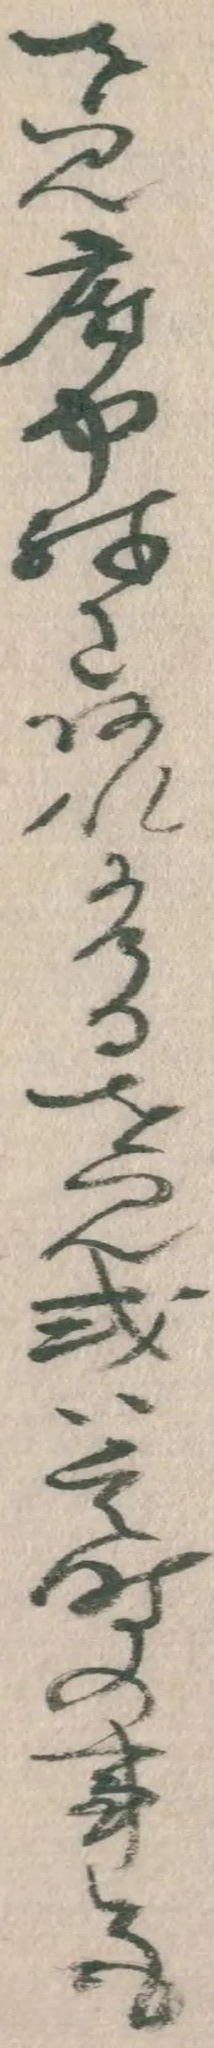を見府中殊にあれにけるを見或は其時の事とも
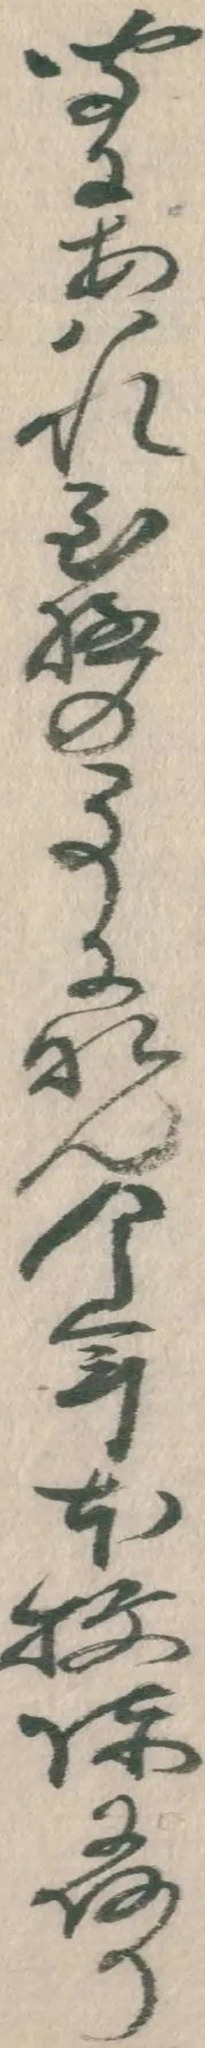聞にあはれ至極の事になん今年本牧陣にあり

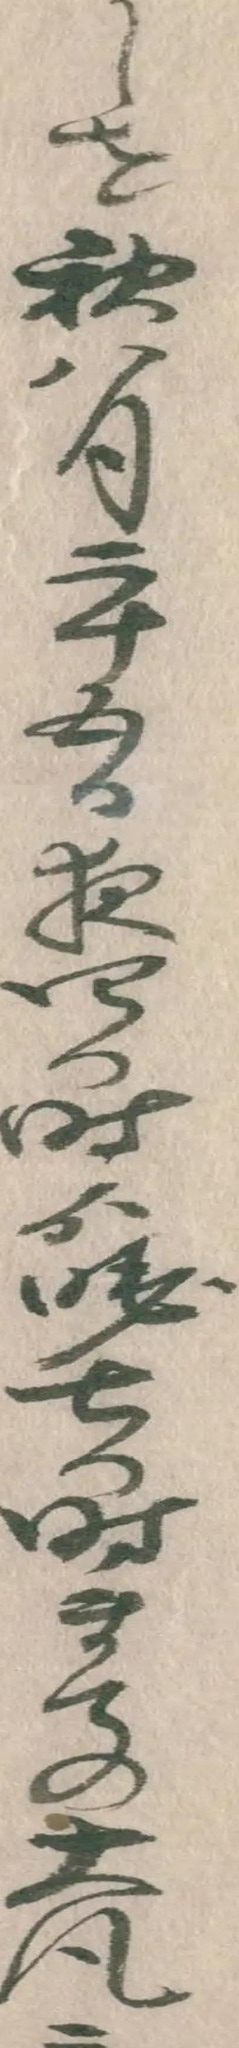しを秋八月二十五日夜四つ時ゟ暁七つ時まての大風に
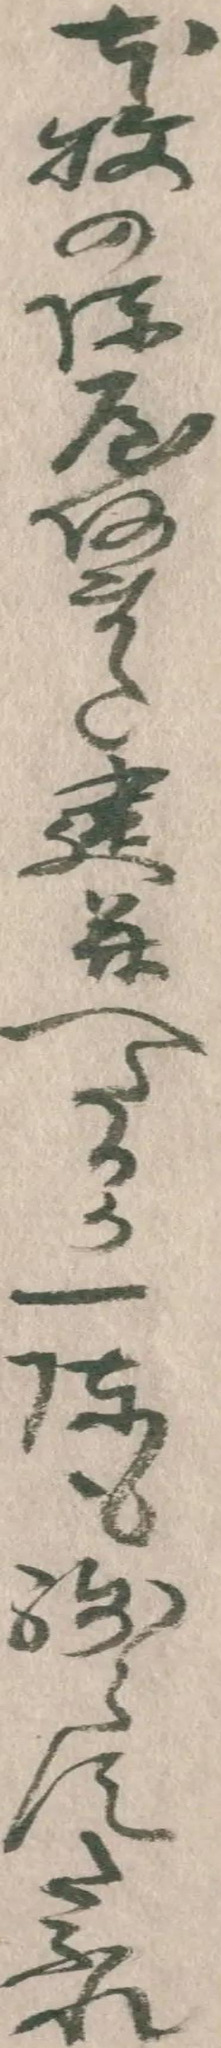本牧の陣屋あまた建並へたるか一棟も残らすたふれ
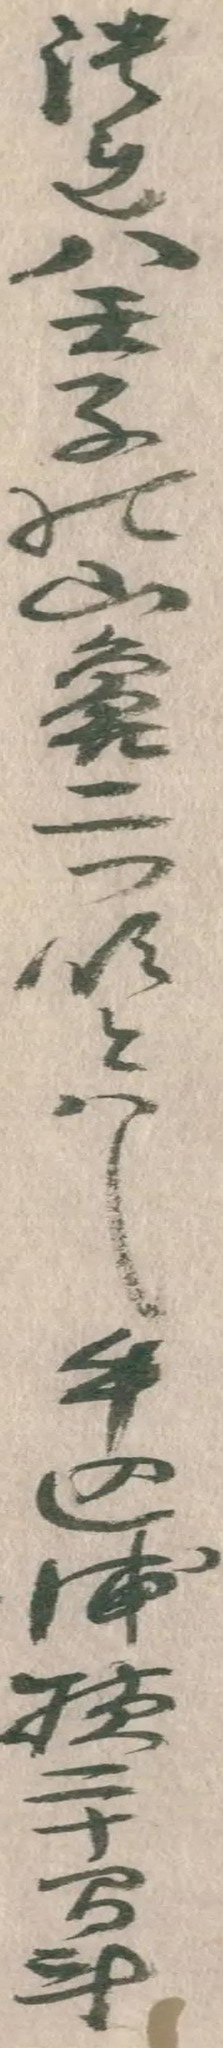潰れ八王子の山鼻二つ吹とはし牛込浦横二十間計
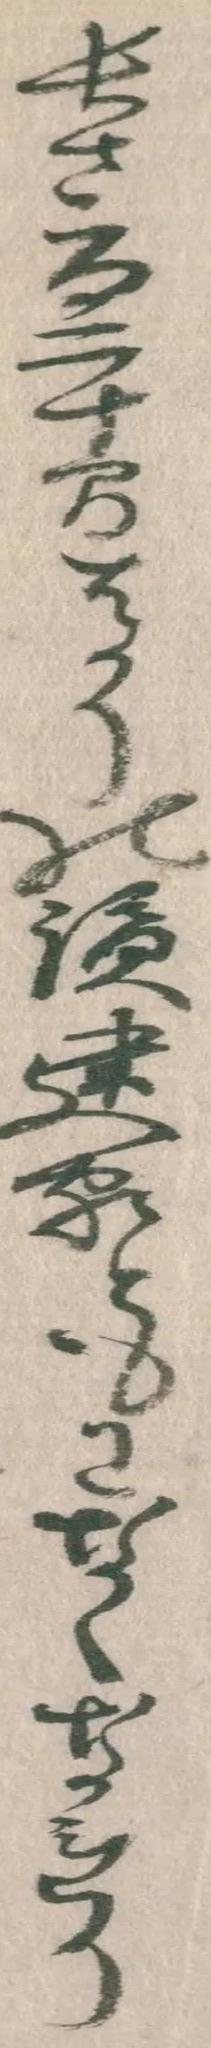長さ百二十間はかりの浜建家ともになくなれり
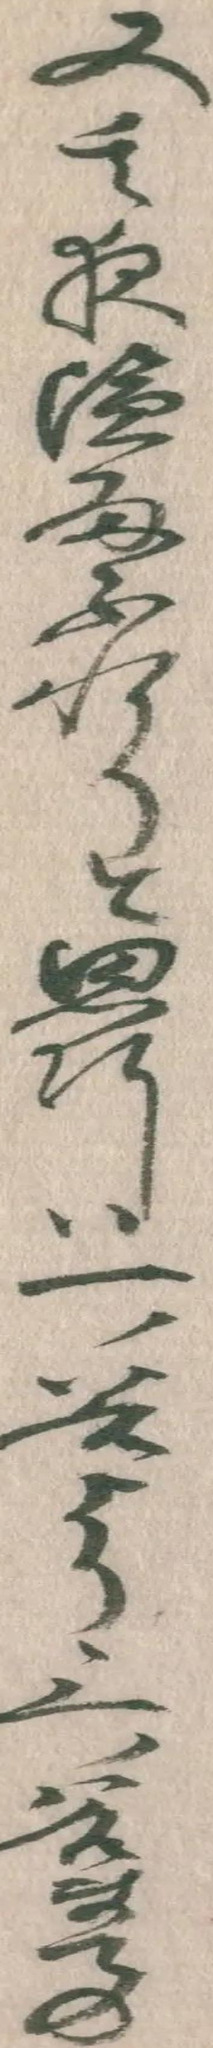又其夜強雨ふれりと思ひしは一ノ谷より三ノ谷まての
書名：出雲紀行. 20
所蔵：国立国会図書館 National Diet Library, JAPAN
